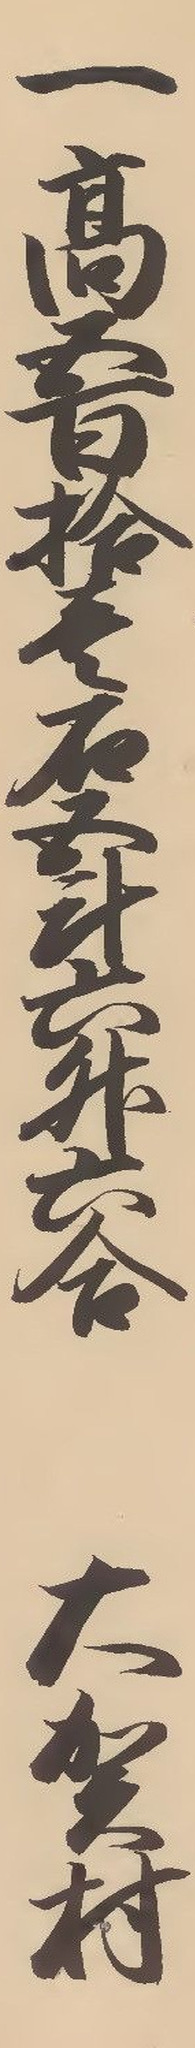一高五百拾壱石五斗六升六合大賀村
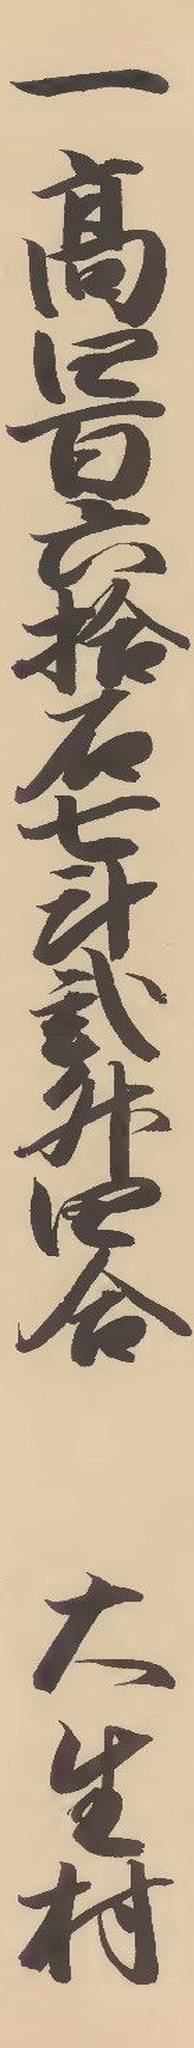一高四百六拾石七斗弐升四合大生村

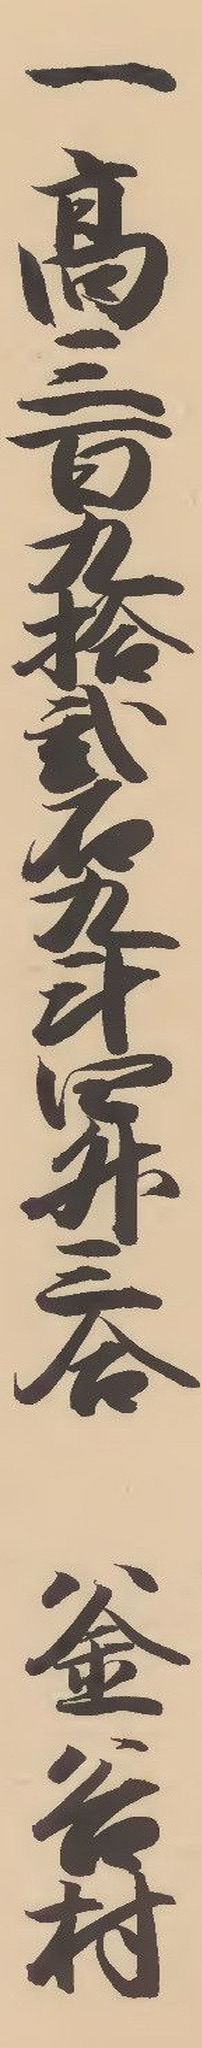一高三百九拾弐石九斗四升三合釜谷村
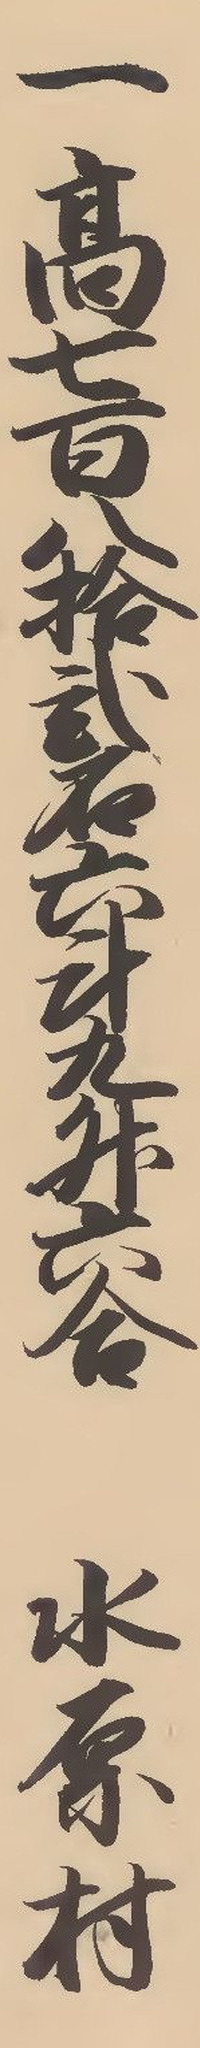一高七百八拾弐石六斗九升六合水原村
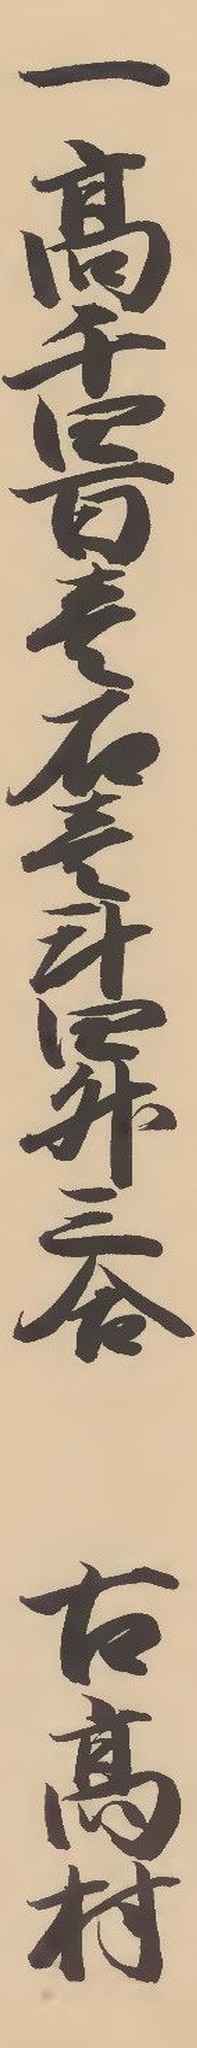一高千四百壱石壱斗四升三合古高村
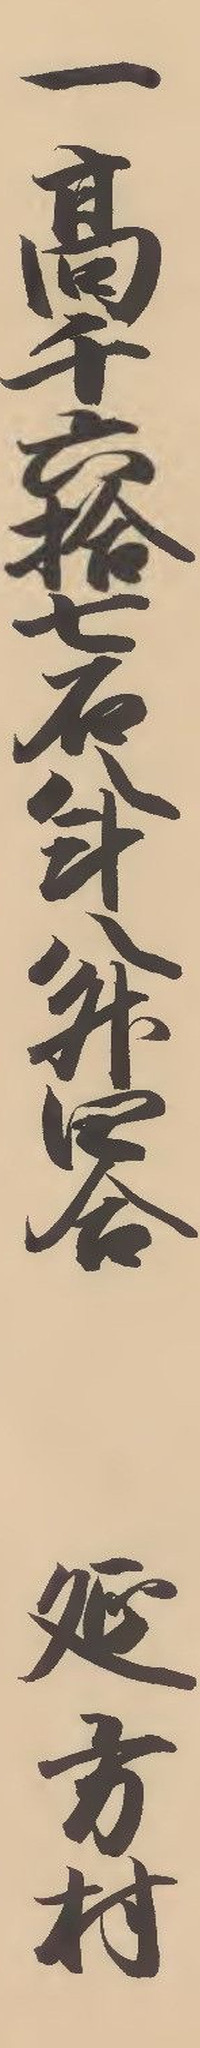一高千六拾七石八斗八升四合延方村
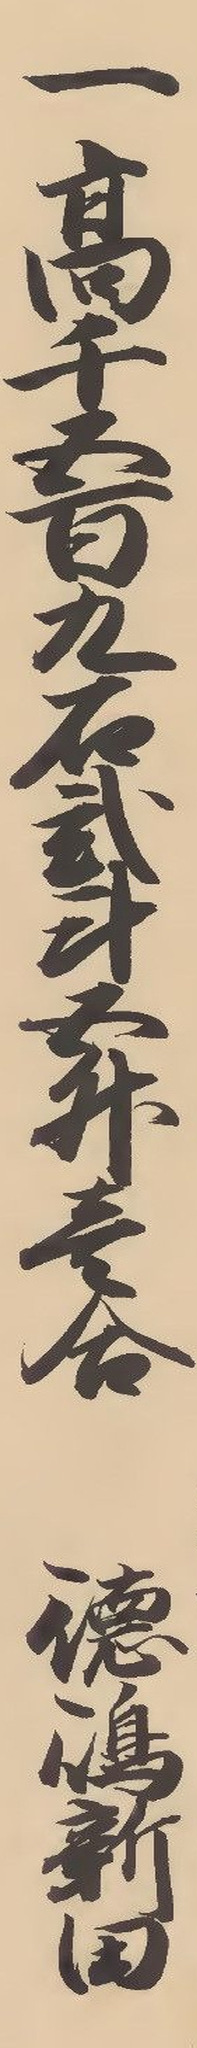一高千五百九石弐斗五升壱合徳島新田
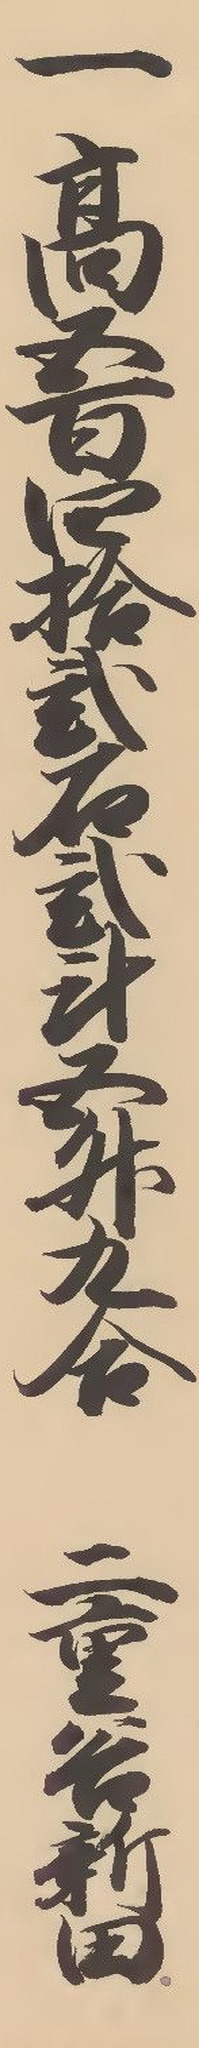一高五百四拾弐石弐斗五升九合二重谷新田
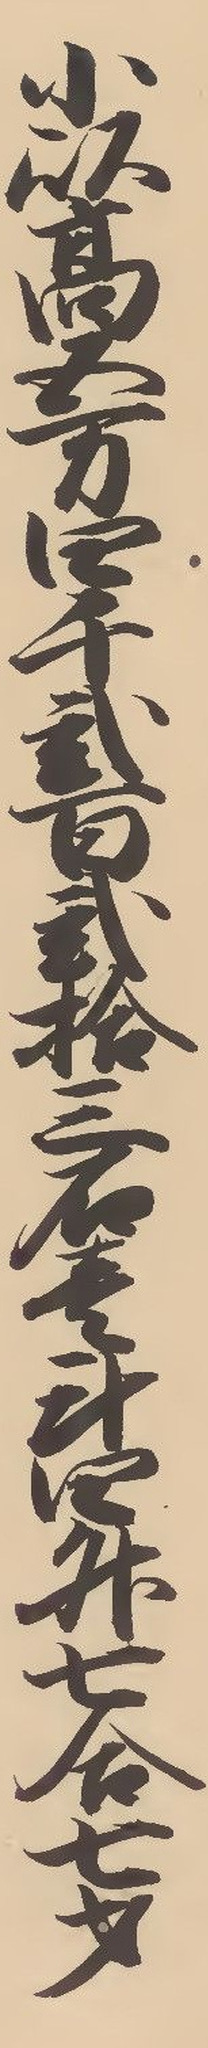小以高五万四千弐百弐拾三石壱斗四升七合七才

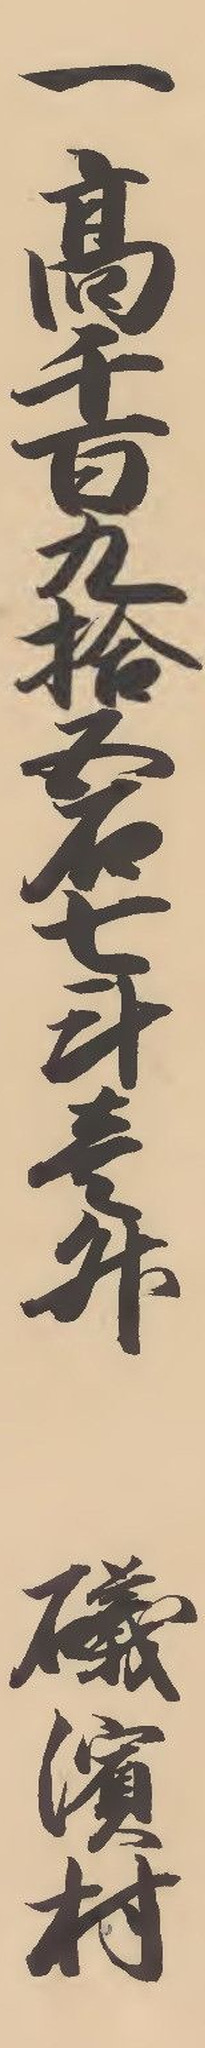一高千百九拾五石七斗壱升磯浜村
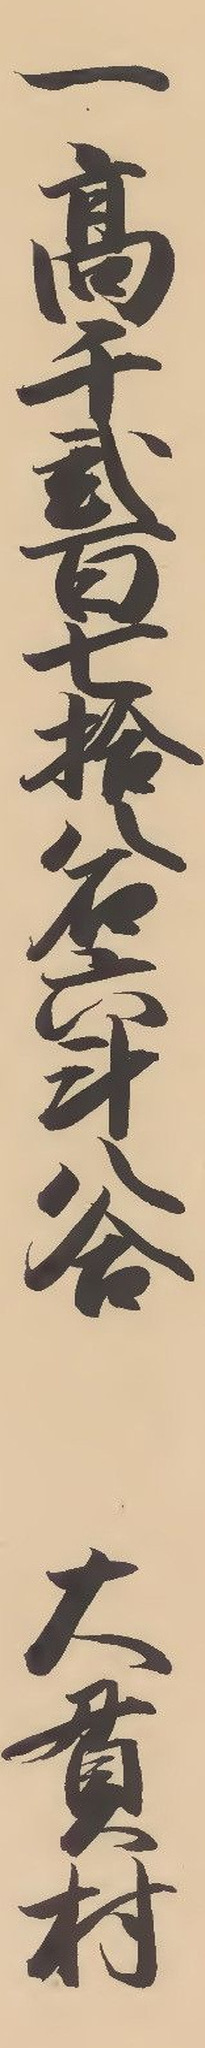一高千弐百七拾八石六斗八合大貫村
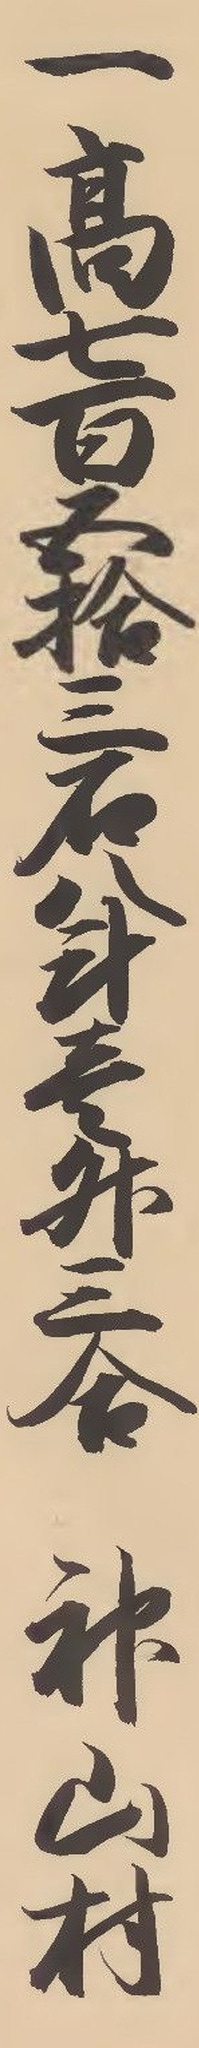一高七百五拾三石八斗壱升三合神山村
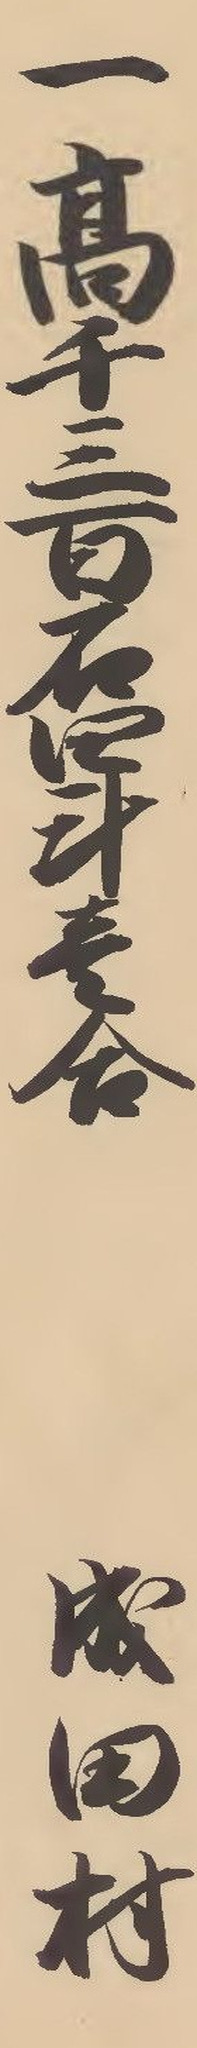一高千三百石四斗壱合成田村
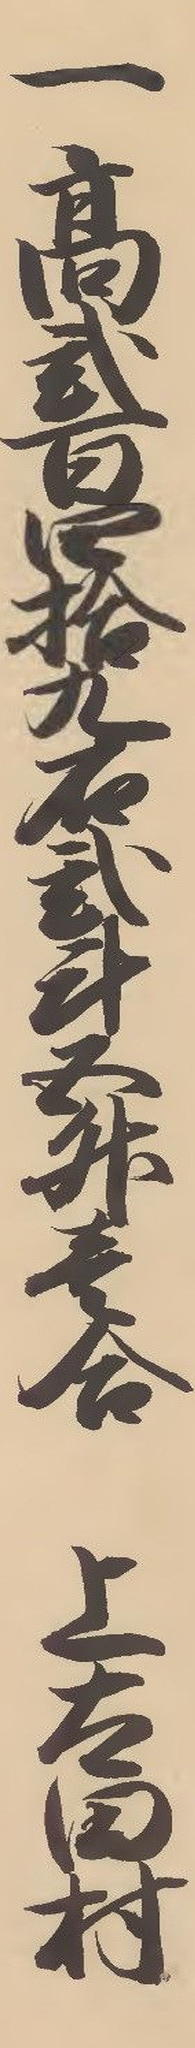一高弐百四拾九石弐斗五升壱合上太田村
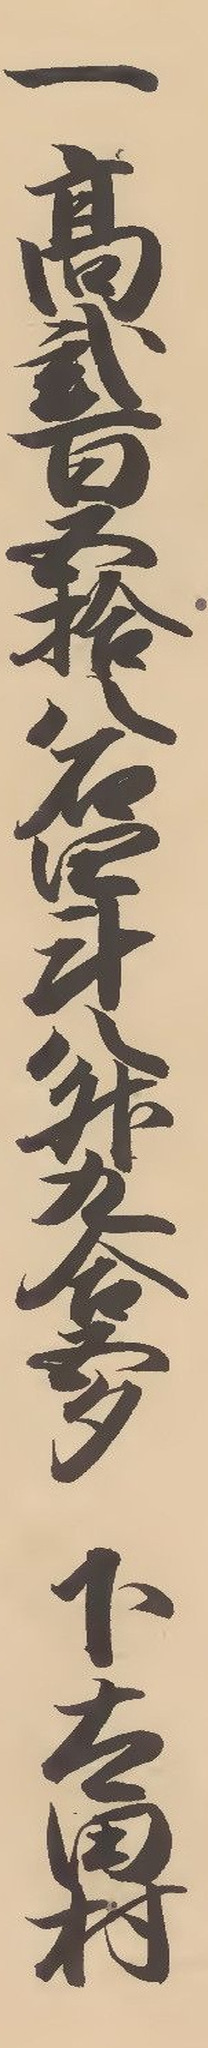一高弐百五拾八石四斗八升九合五勺下太田村
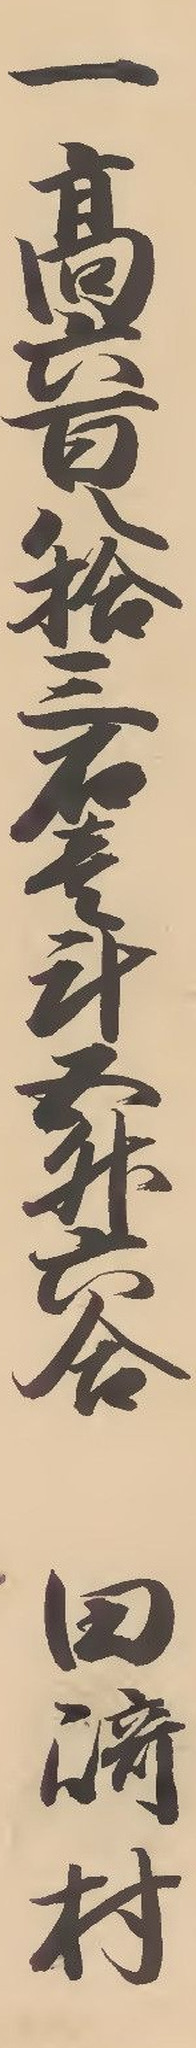一高六百八拾三石壱斗五升六合田崎村
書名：常陸国郷帳
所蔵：国立公文書館 National Archives of Japan
